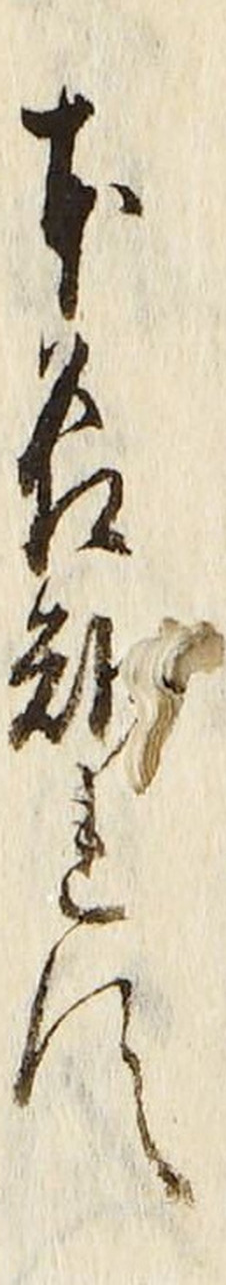本名知れす
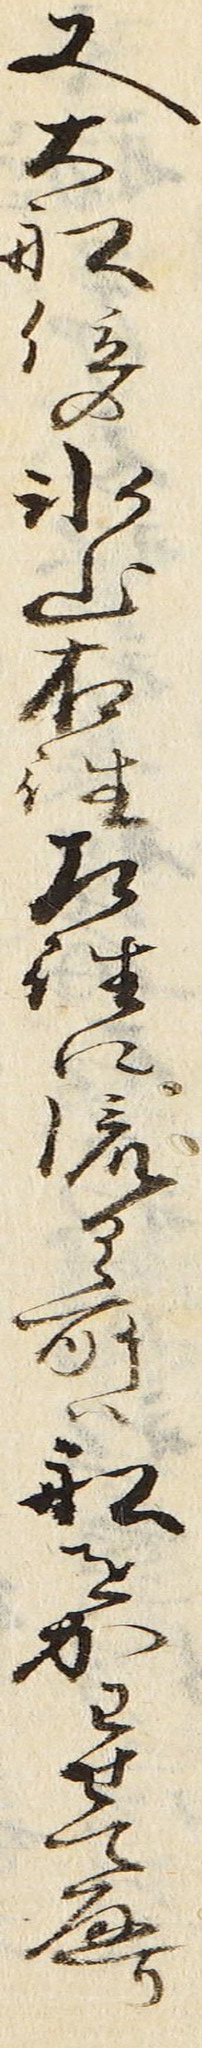又大船位の氷山右往左往に流るゝ所ハ船をかわせて通り
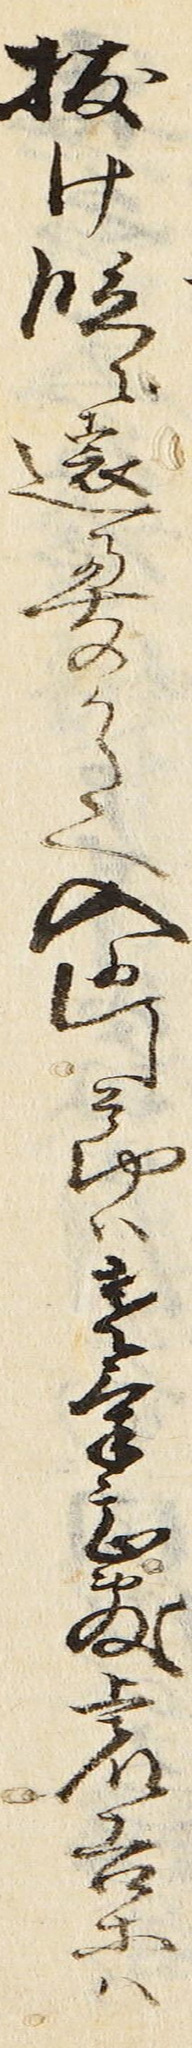抜け段々遠奥のかたへ入込し節ハ寒気甚敷虎吉等ハ
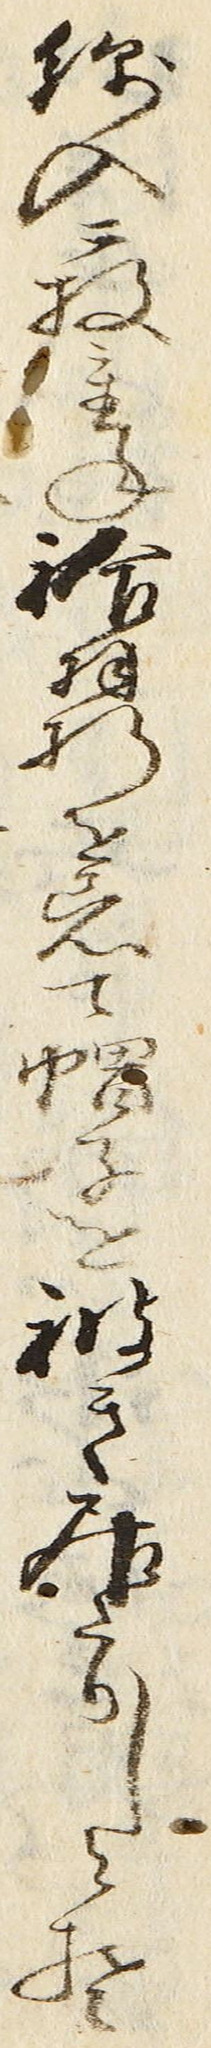綿入二枚重ね袷羽折を着て帽子を被き居たりしとそ
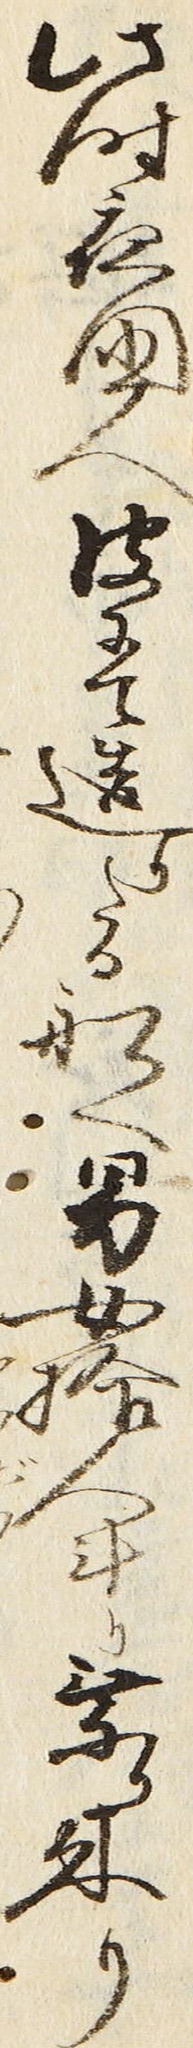此時夜国人皮にて造りたる船へ男女拾人計り乗り来り
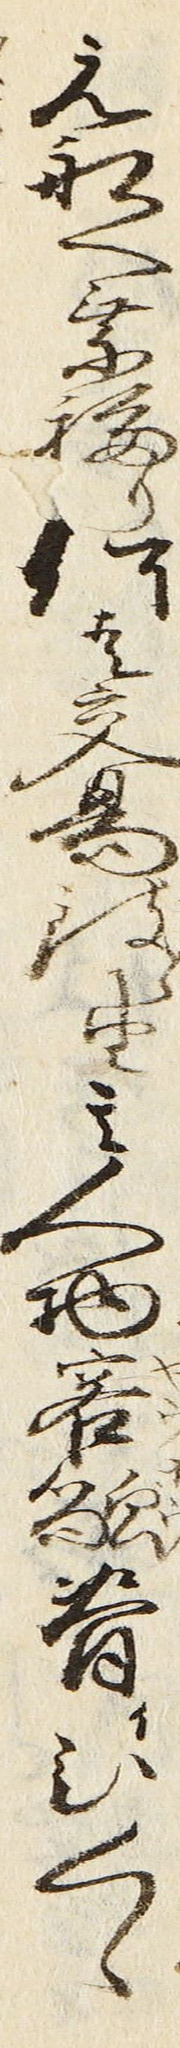元船へ乗移り何そ交易致候由其人物容貌背イひくゝ
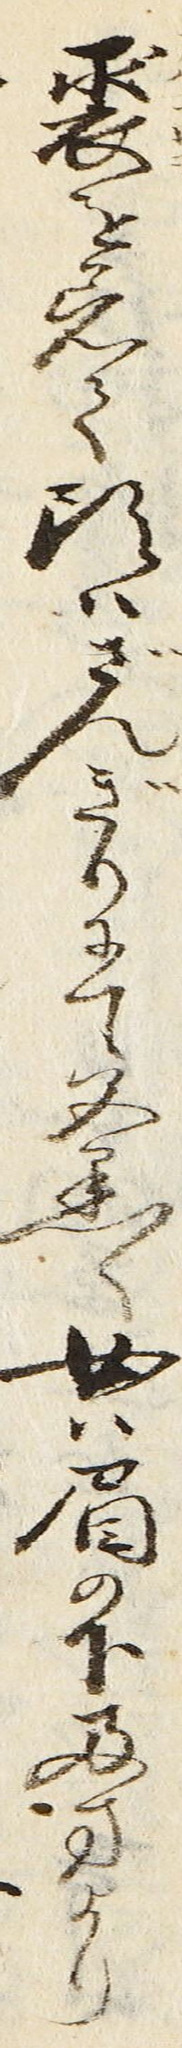裘を着て頭ハざんぎりにて色黒く女ハ眉の下両方より
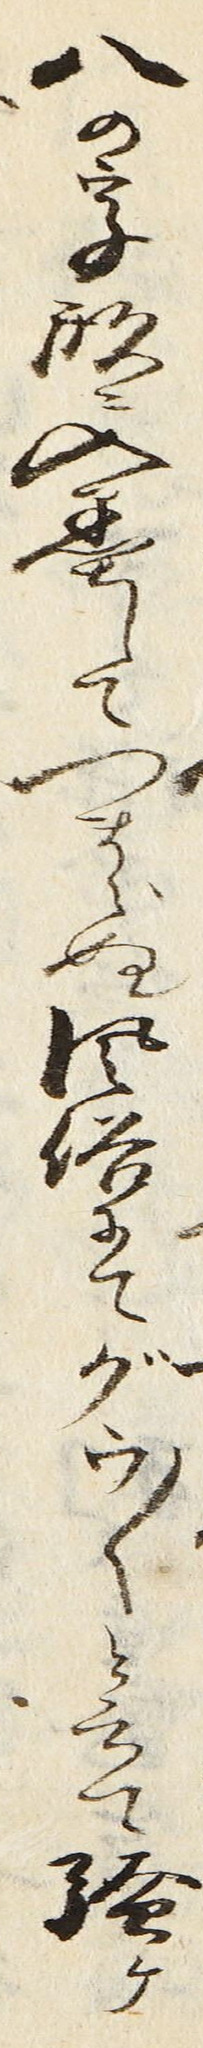八の字形ニ入墨してつまらぬ風俗にてグウ〳〵と云て騒ケ
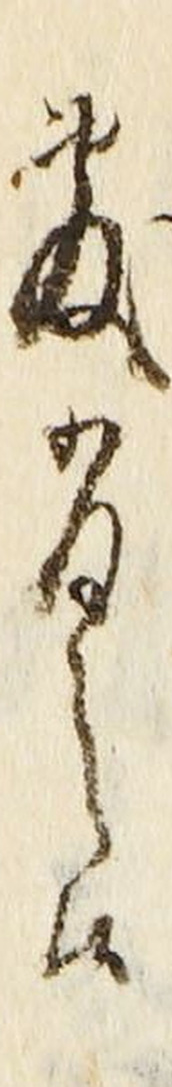敷有之候
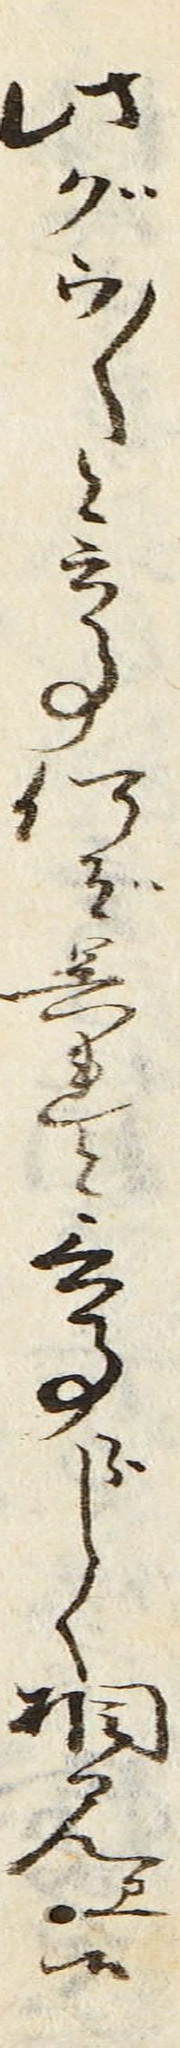此グウ〳〵と云事何ぞ呉れと云事らしく相見エ候
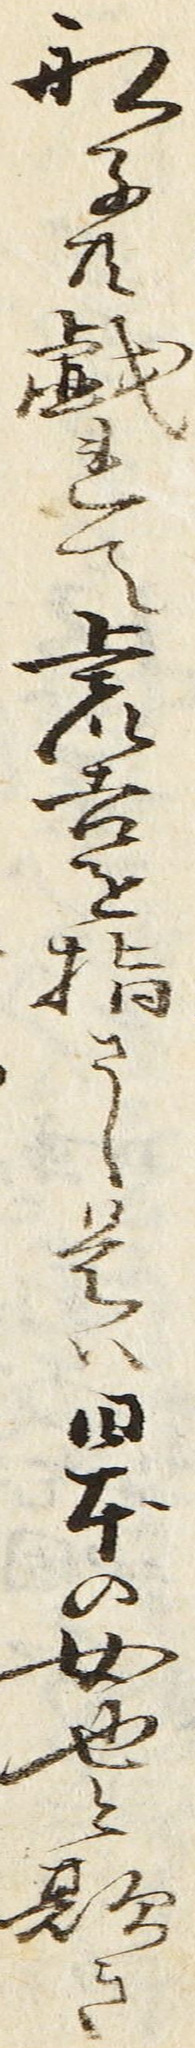船子共戯れて虎吉を指さし是ハ日本の女也と欺き
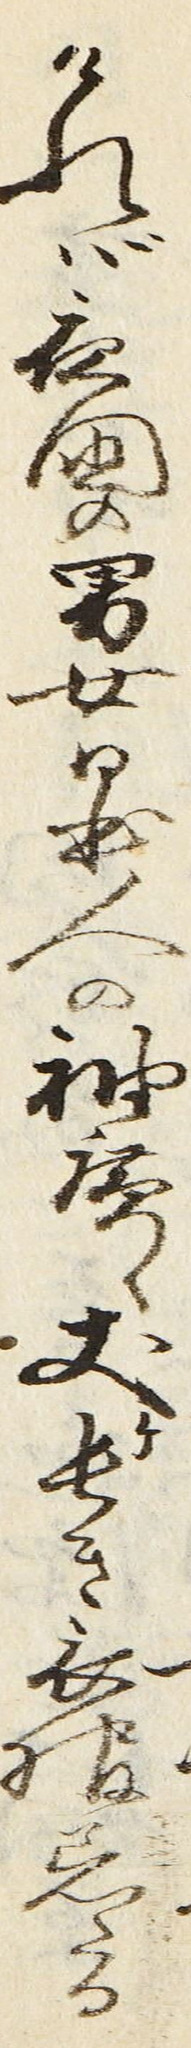けれバ夜国の男女日本人の袖広く丈ケ長き衣服着たる
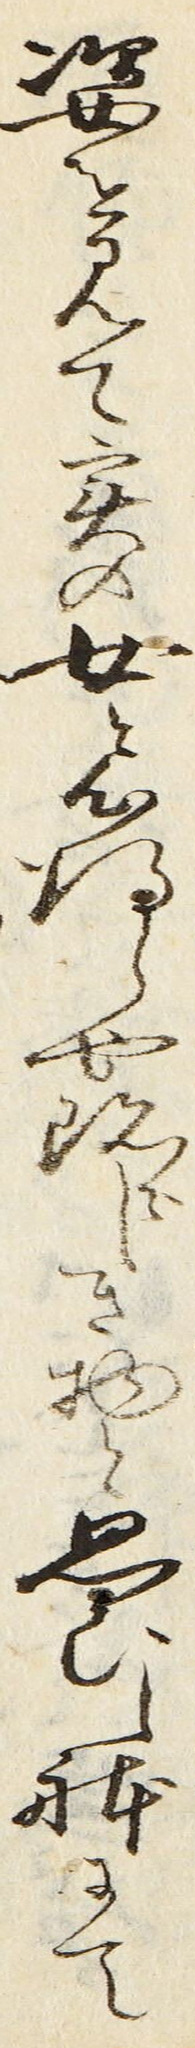姿を見て実の女と心得しや珍らしき物と思ひし体にて
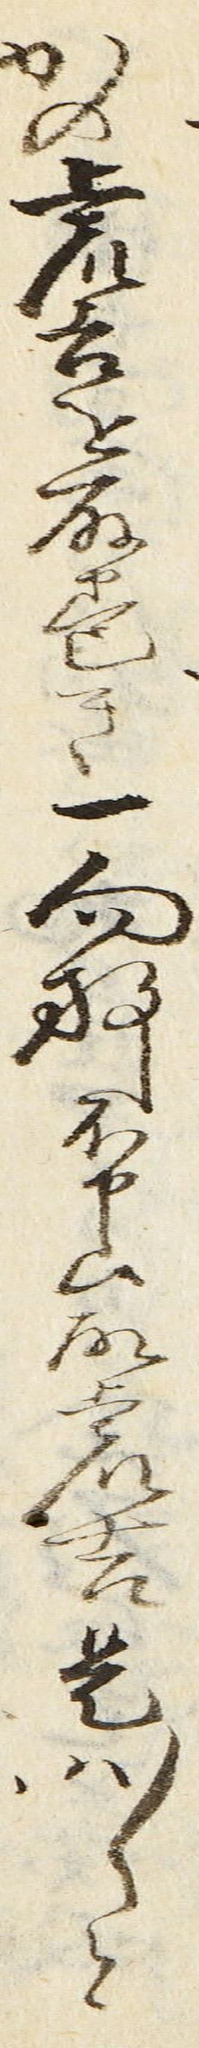かの虎吉を取巻き一向放不申候故虎吉是ハ〳〵と
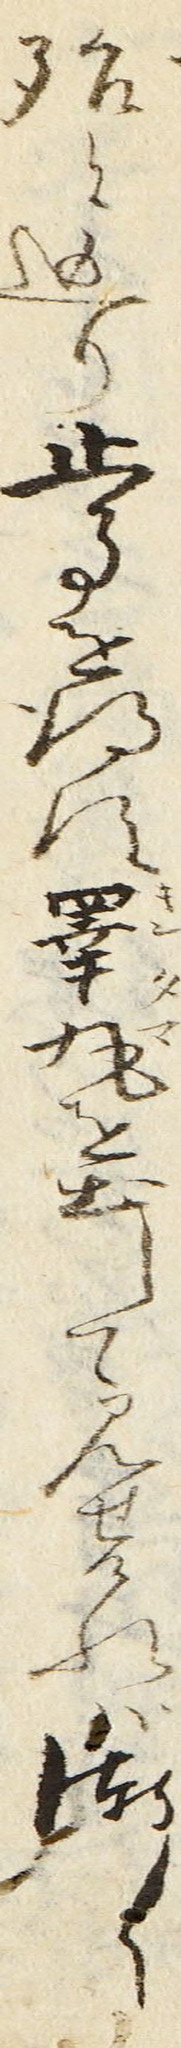殆と込り止事を得す睾丸を出して見せけれバ漸く
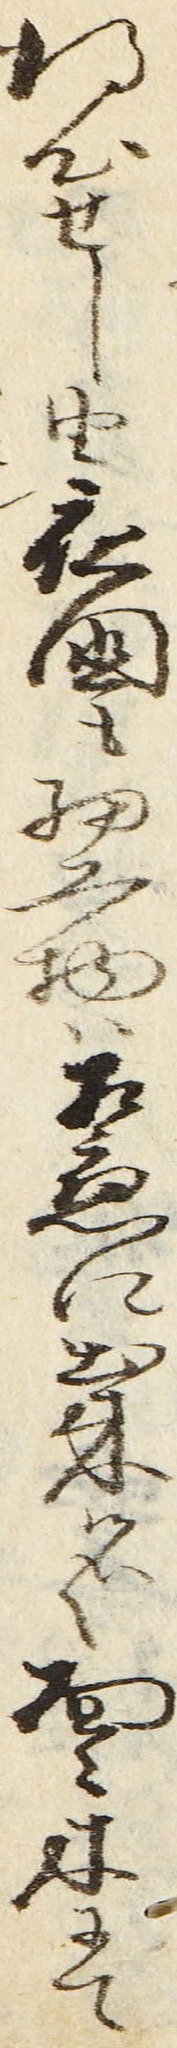得心せし由夜国も細工物ハ相応に出来候て面々木にて
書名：亜墨利加漂流記聞
